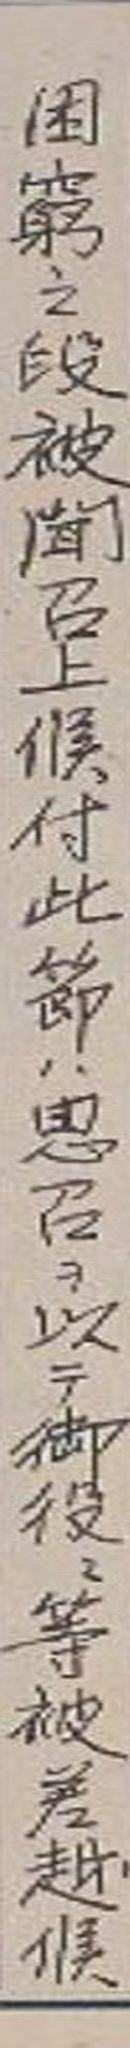困窮之段被聞召上候付此節は思召を以て御役々等被差越候
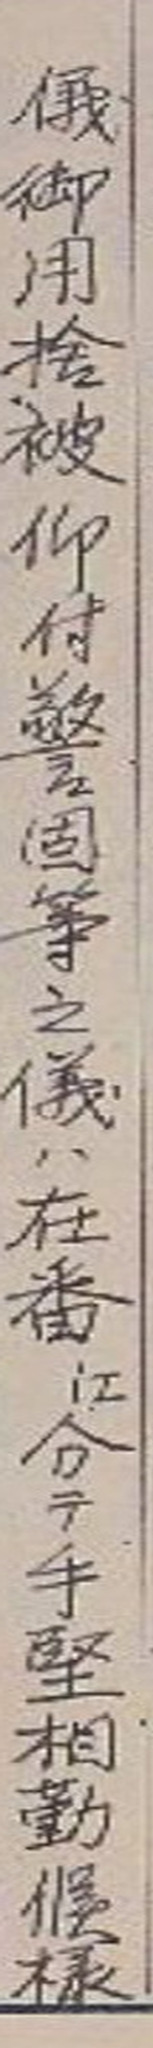儀御用捨被仰付警固等之儀は在番え分て手堅相勤候様
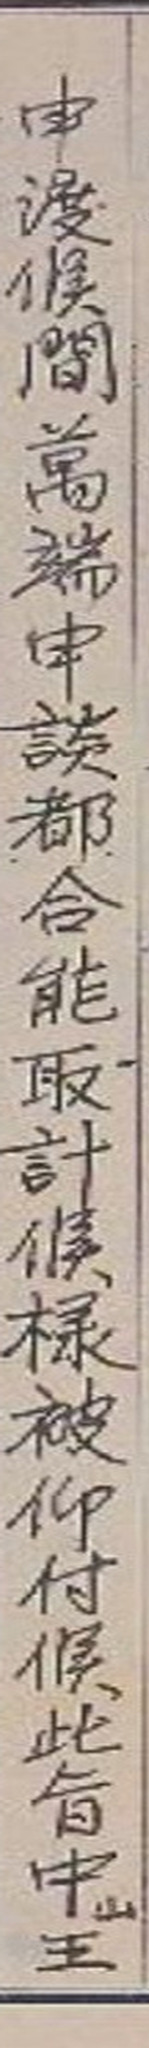申渡候間万端申談都合能取計候様被仰付候此旨中山王
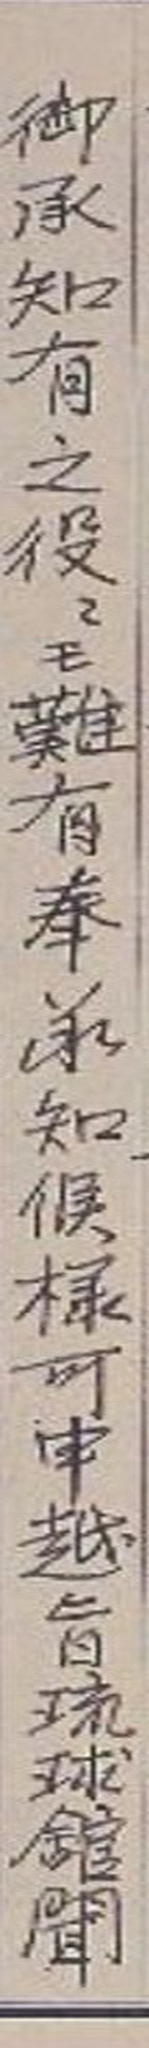御承知有之役々も難有奉承知候様可申越旨琉球館聞
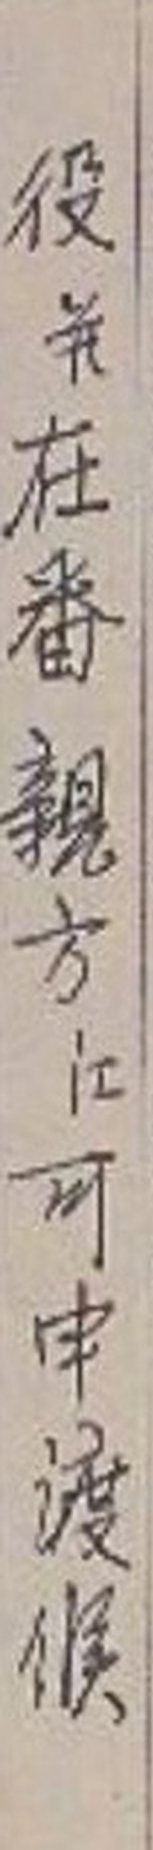役并在番親方え可申渡候
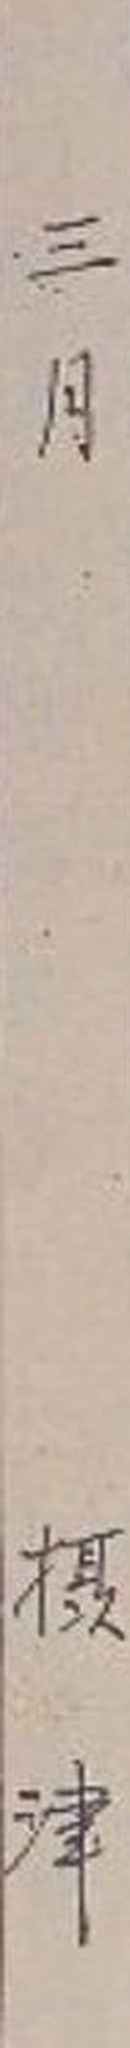三月摂津

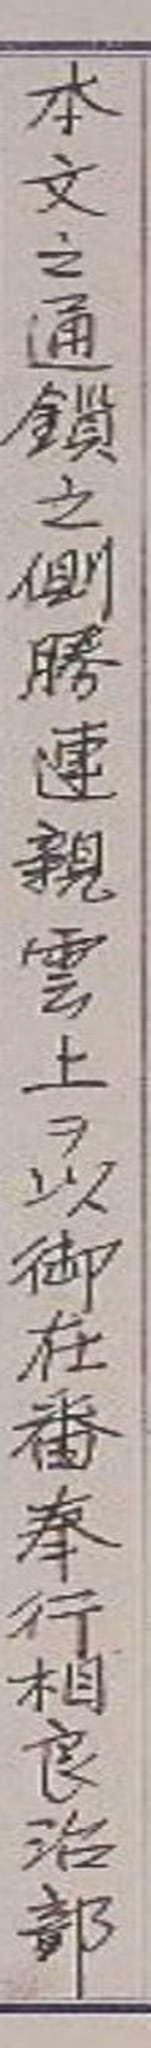本文之通鎖之側勝連親雲上を以御在番奉行相良治部
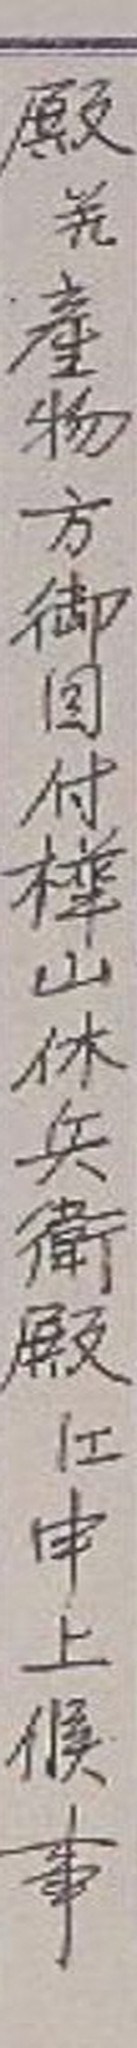殿并産物方御目付樺山休兵衛殿え申上候事
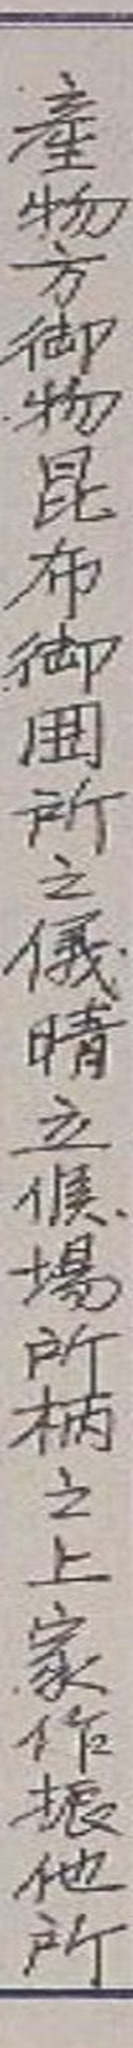産物方御物昆布御囲所之儀晴立候場所柄之上家作振他所
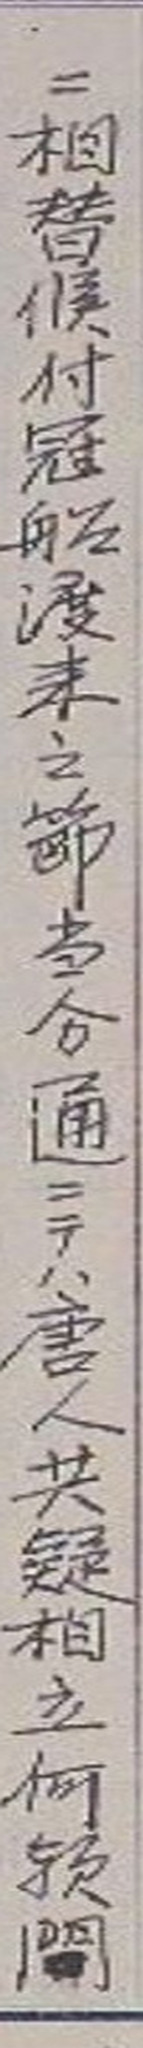に相替候付冠船渡来之節当分通にては唐人共疑相立何歟問
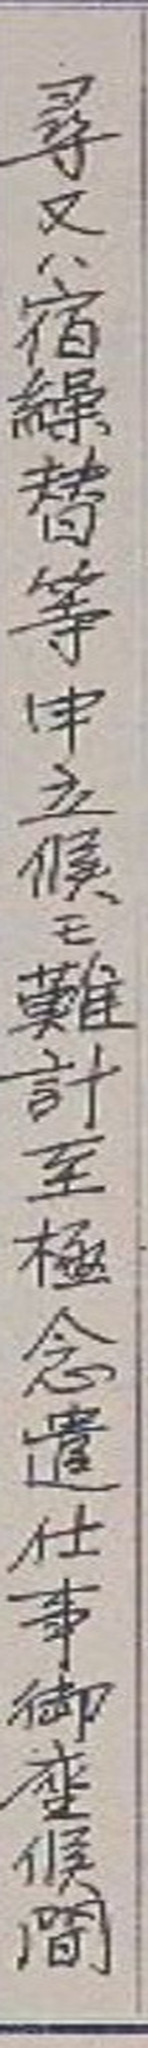尋又は宿繰替等申立候も難計至極念遣仕事御座候間
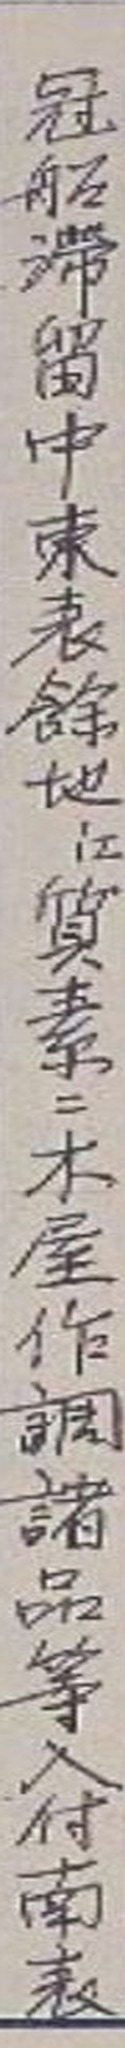冠船滞留中東表余地え質素に木屋作調諸品等入付南表
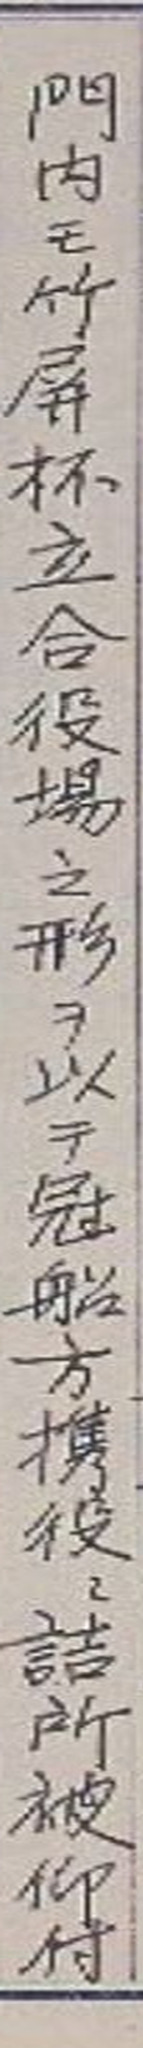門内も竹屏抔立合役場之形を以て冠船方携役々詰所被仰付
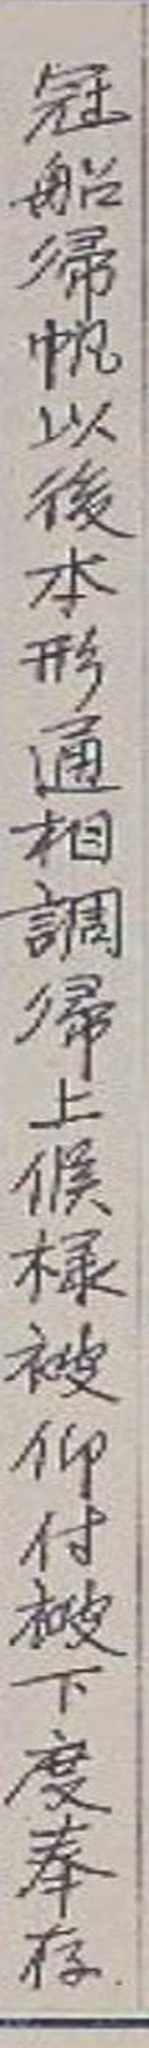冠船帰帆以後本形通相調帰上候様被仰付被下度奉存
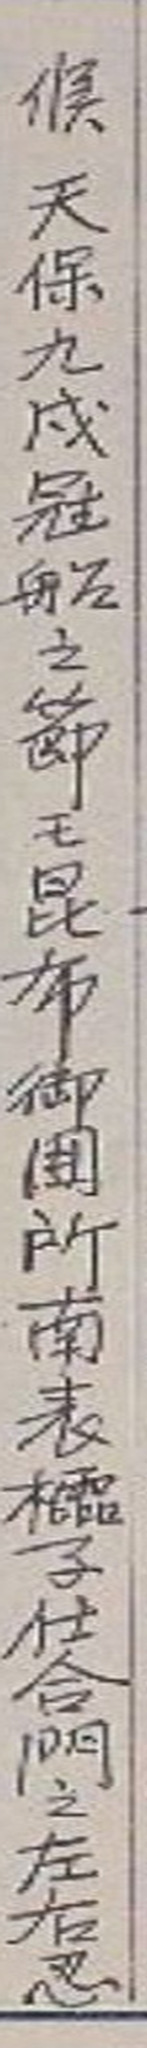候天保九戌冠船之節も昆布御囲所南表櫺子付合門之左右忍
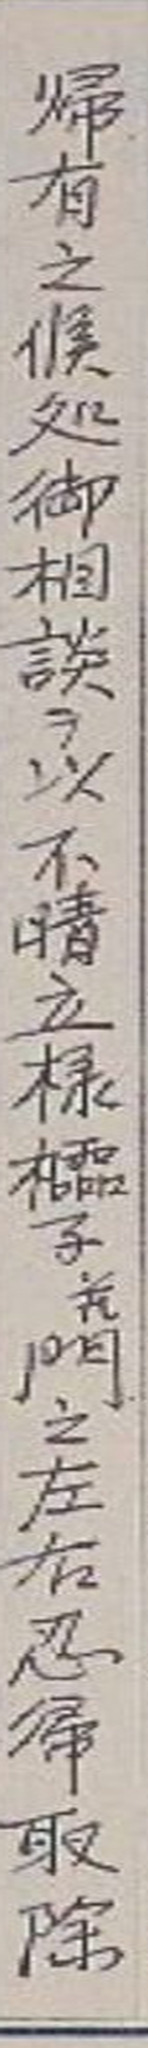帰有之候処御相談を以不晴立様櫺子并門之左右忍帰取除
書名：支那冊封使来琉諸記 下巻
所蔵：University of the Ryukyus Library
